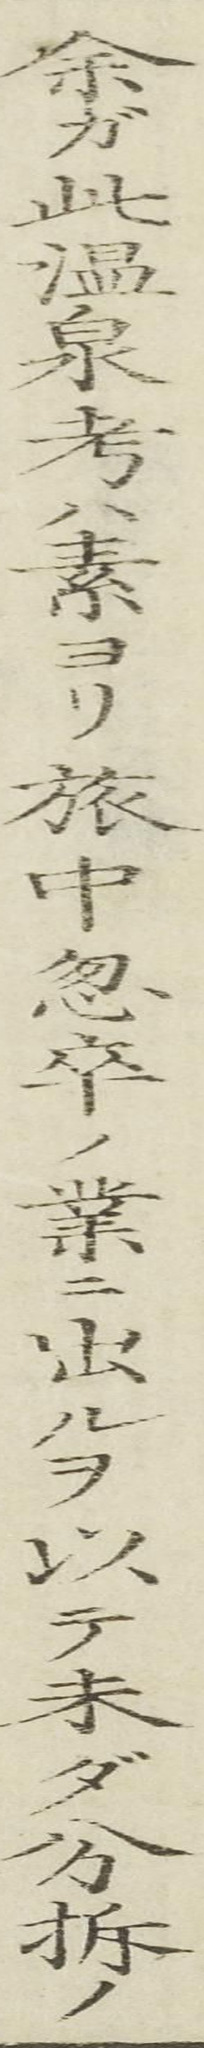余ガ此温泉考ハ素ヨリ旅中忽卒ノ業ニ出ルヲ以テ未ダ分析ノ
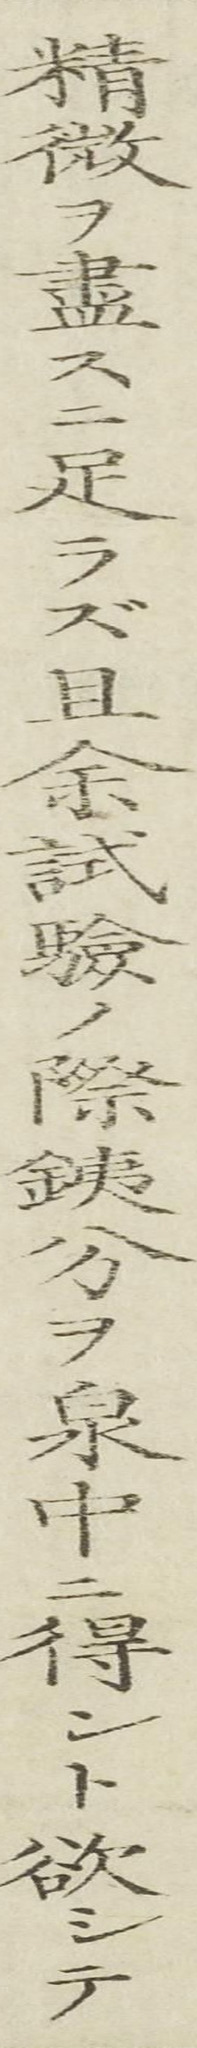精徴ヲ盡スニ足ラズ且余試験ノ際銕分ヲ泉中ニ得ント欲シテ
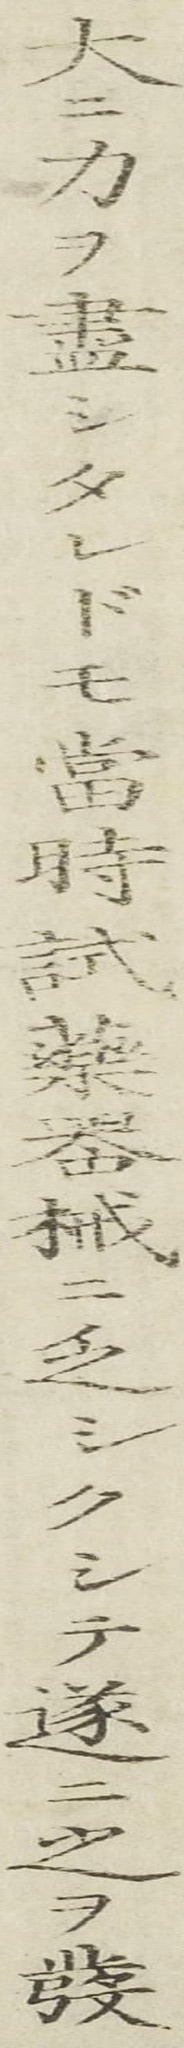大ニ力ヲ盡シタレドモ当時試薬器械ニ乏シクシテ遂ニ之ヲ発
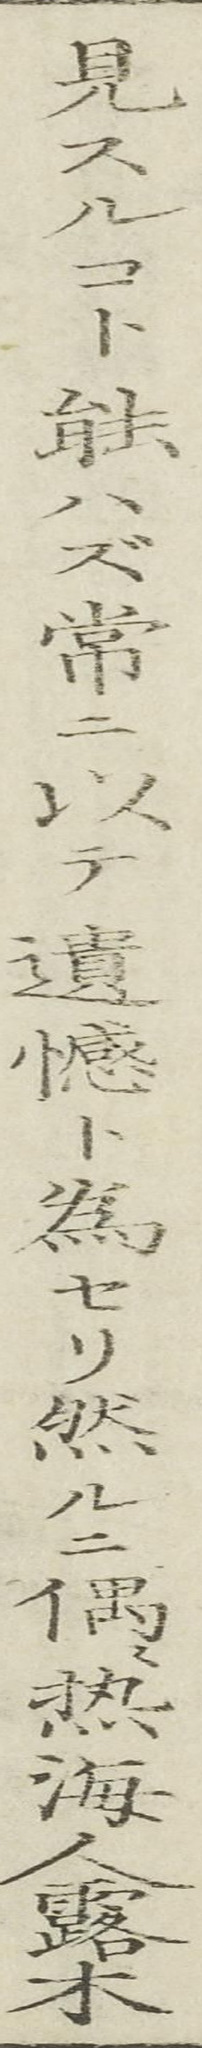見スルコト能ハズ常ニ以テ遺憾ト為セリ然ルニ偶々熱海人露木
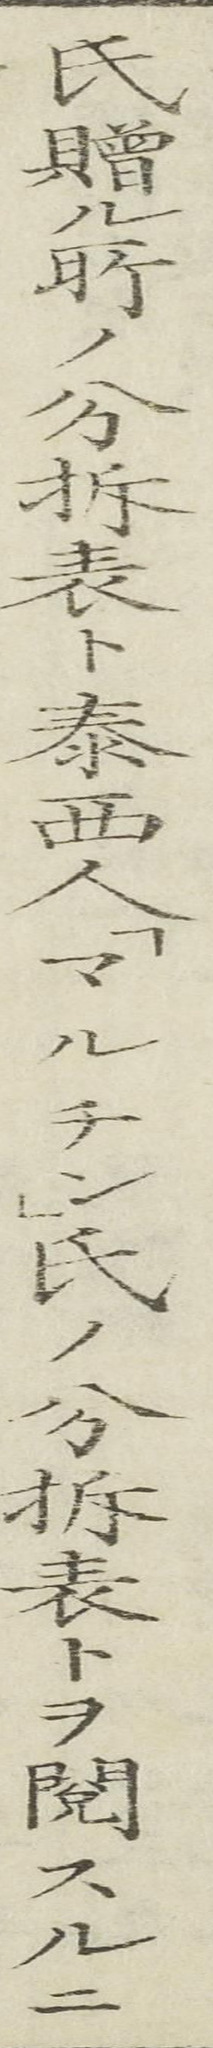氏贈ル所ノ分析表ト泰西人「マルチン」氏ノ分析表トヲ閲スルニ
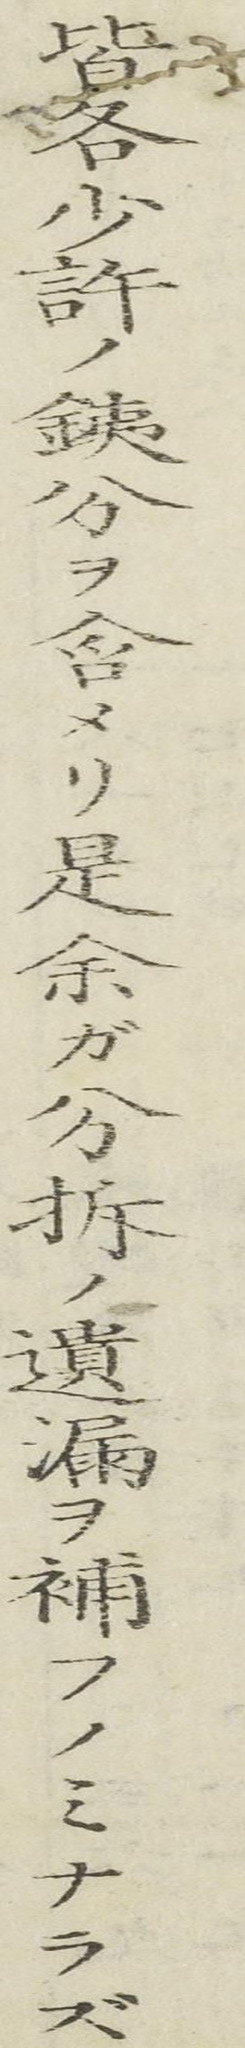皆各少許ノ銕文ヲ含メリ是余ガ分析ノ遺漏ヲ補フノミナラズ
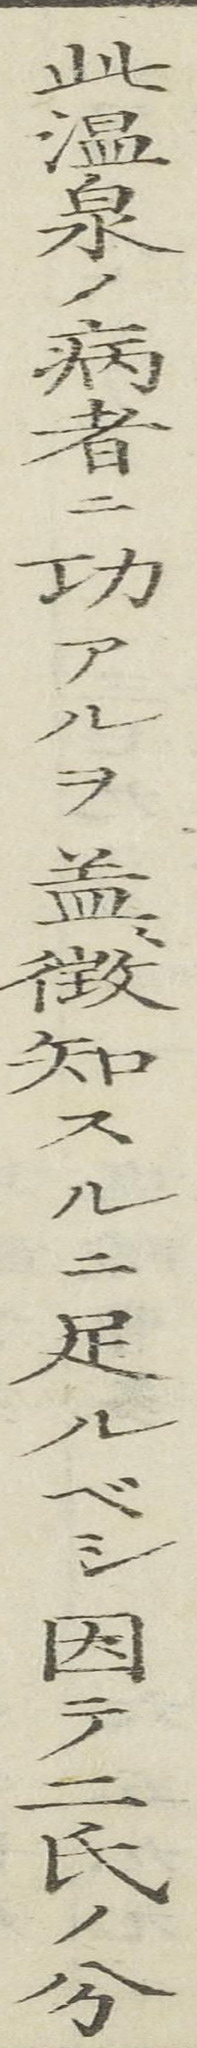此温泉ノ病者ニ功アルヲ益々徴知スルニ足ルベシ因テ二氏ノ分
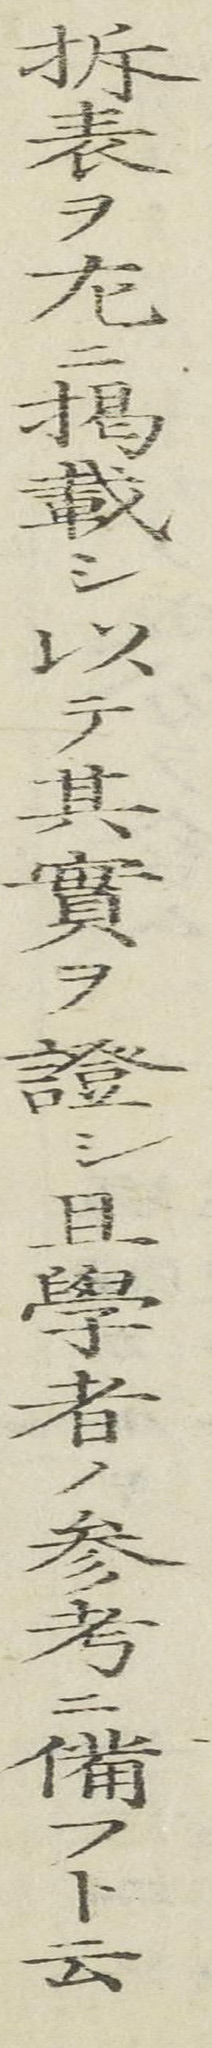析表ヲ左ニ掲載シ以テ其実ヲ證シ且学者ノ参考ニ備フト云
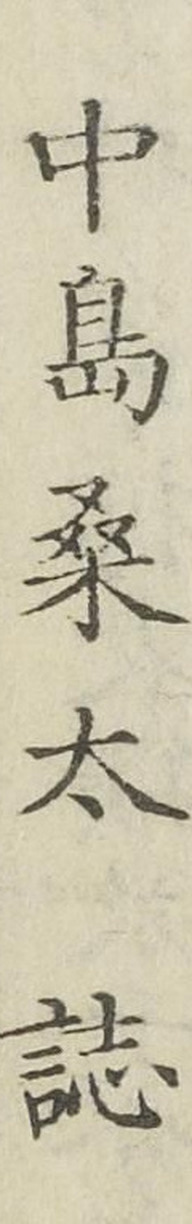中島桑太誌

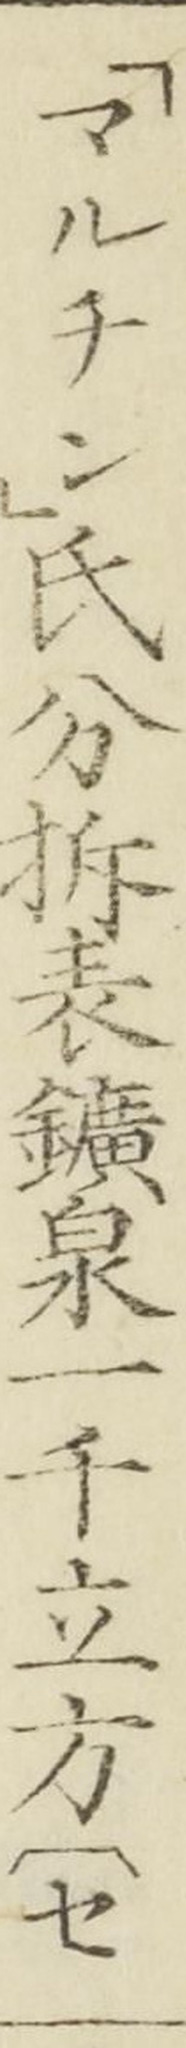「マルチン」氏分析表鉱泉一千立方〔セ
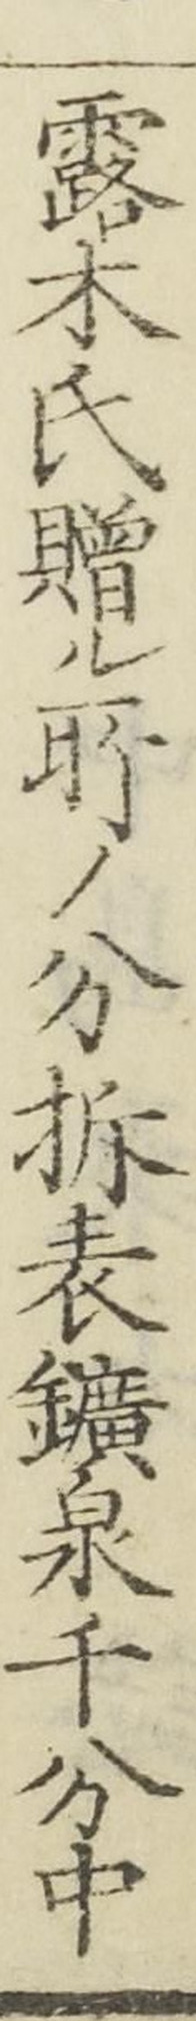露木氏贈ル所ノ分析表鉱泉千分中
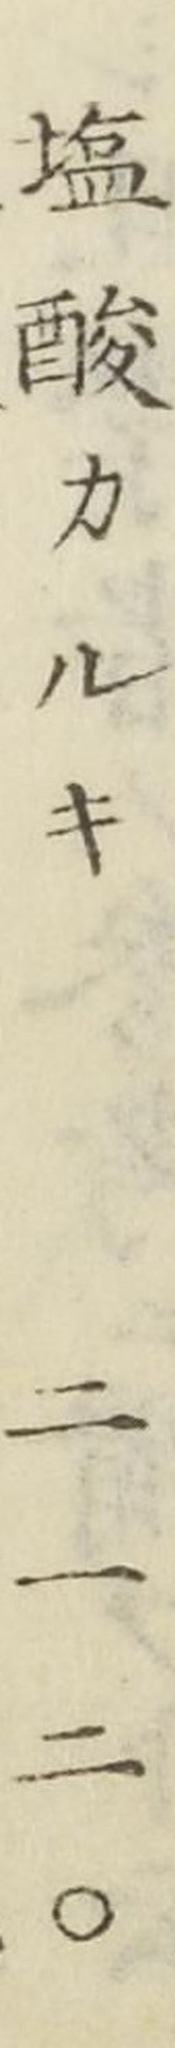塩酸カルキ二一二〇
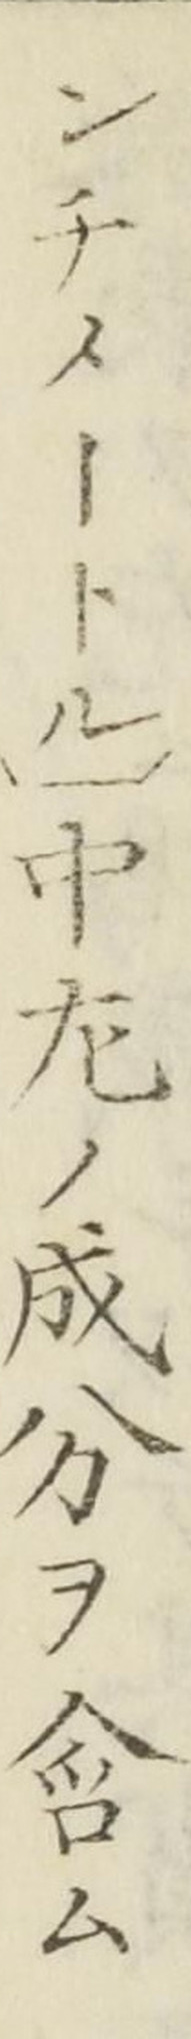ンチメートル〕中左ノ成分ヲ含ム
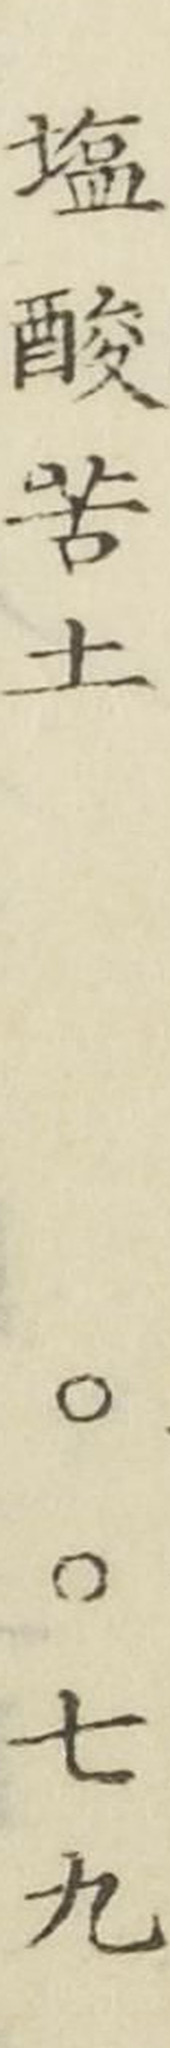塩酸苦土〇〇七九
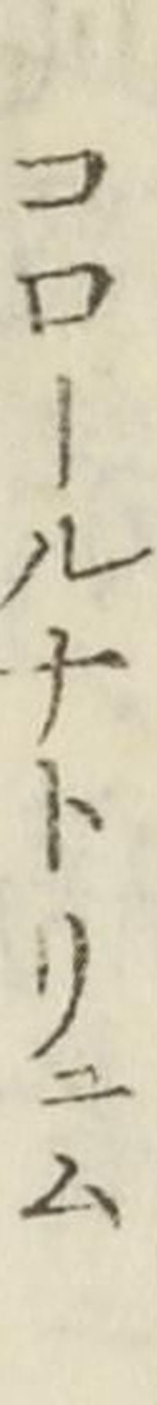ブロームナトリュム同
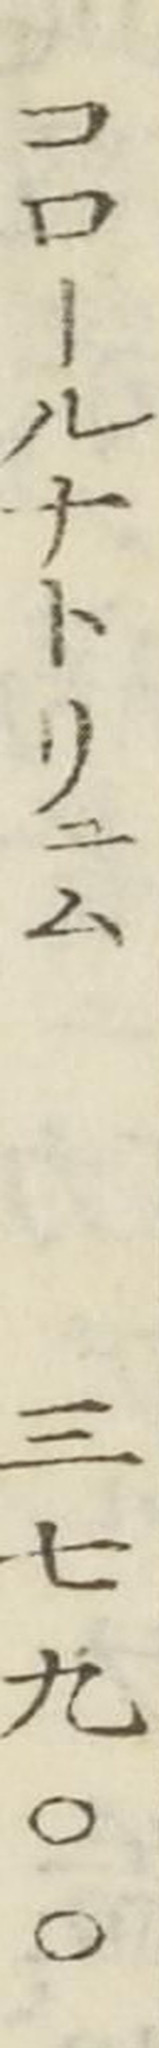コロールナトリュム三七九〇〇
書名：熱海温泉考　全
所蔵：東京大学地震研究所図書室 Earthquake Research Institute Library, The University of Tokyo, JAPAN
